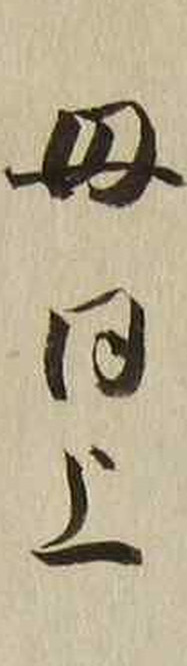母同上
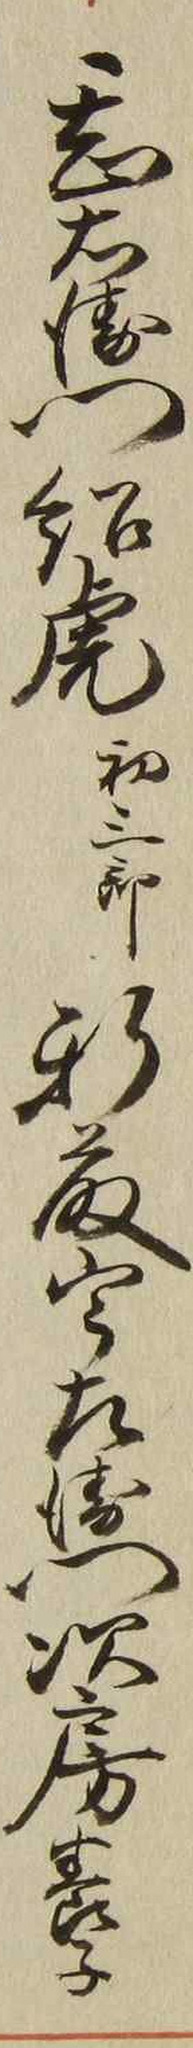甚右衛門紹虎初三郎新藤宇左衛門次房養子
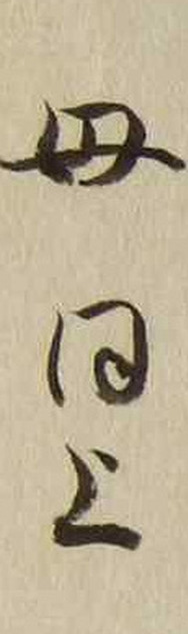母同上

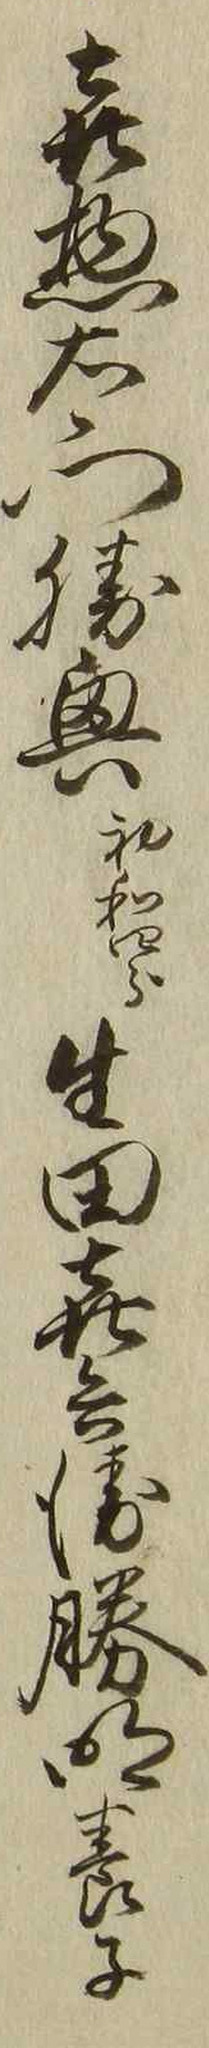喜惣右衛門勝奧初和四郎生田喜兵衛勝明養子
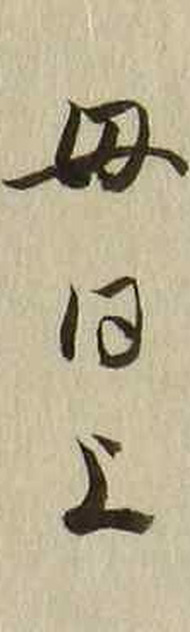母同上
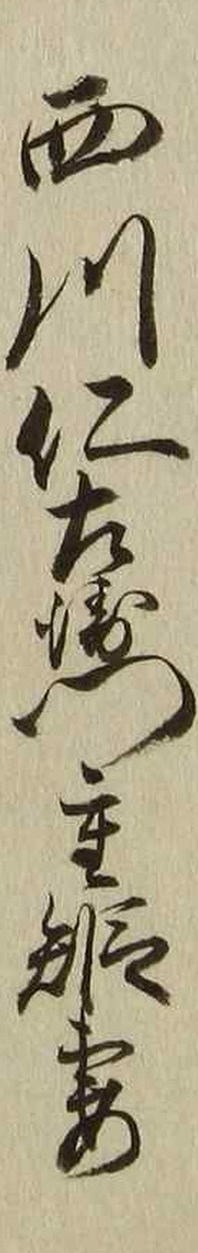女西川仁左衛門重矩妻
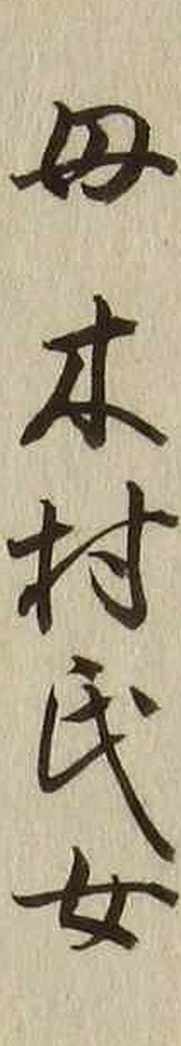母木村氏女
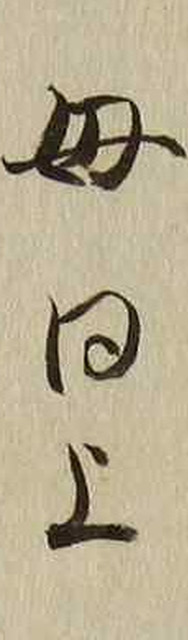母同上
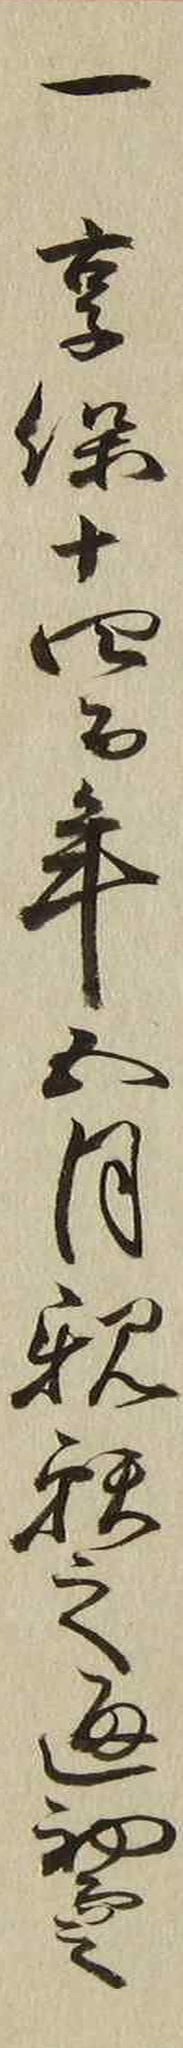一享保十四酉年五月親願之通初而之
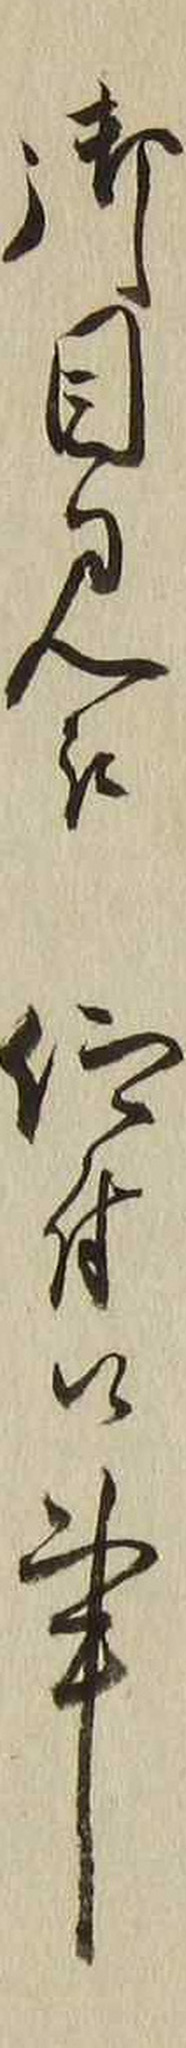御目見被仰付候事
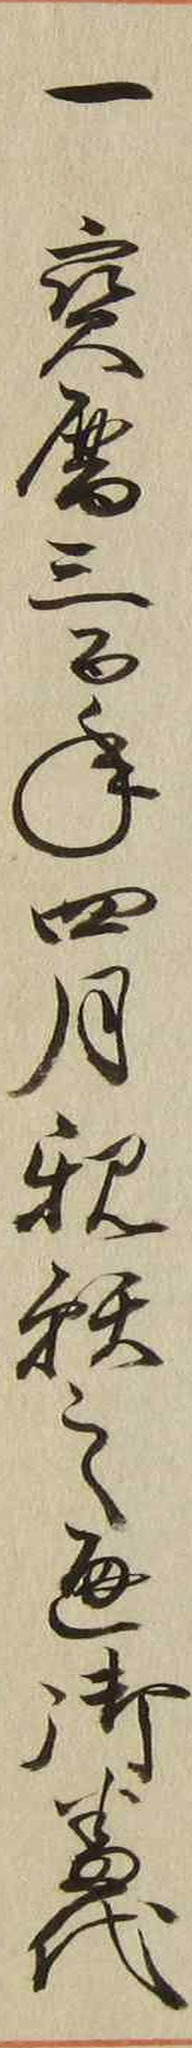一宝暦三酉年四月親願之通御番代
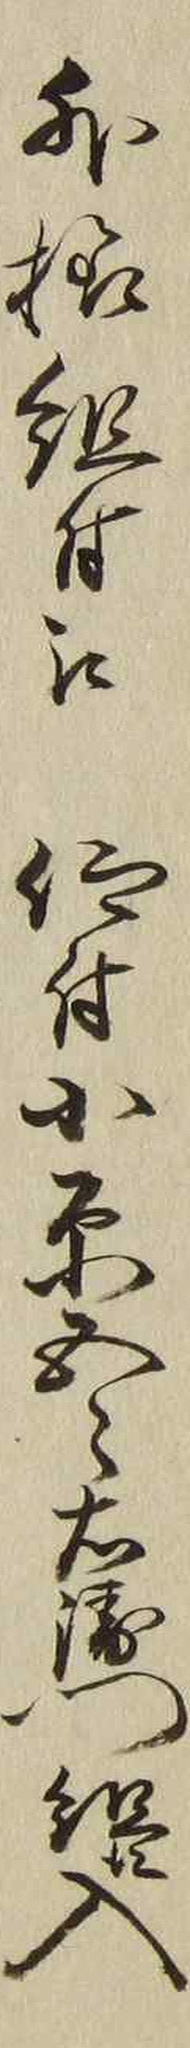外様組付被仰付小原五郎右衛門組江入
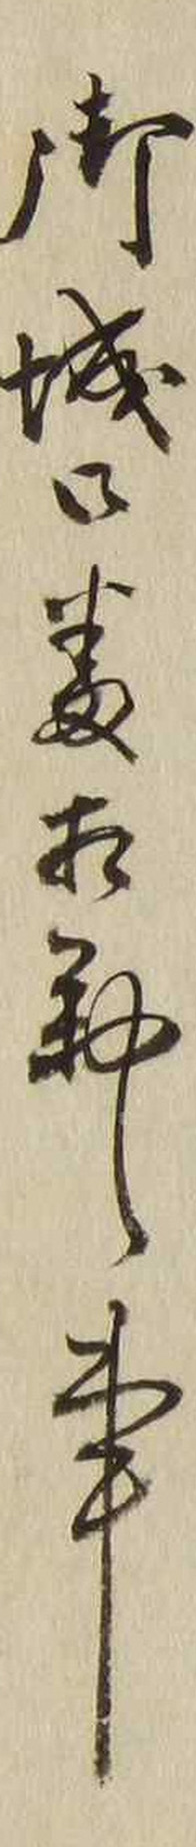御城御番相勤候事

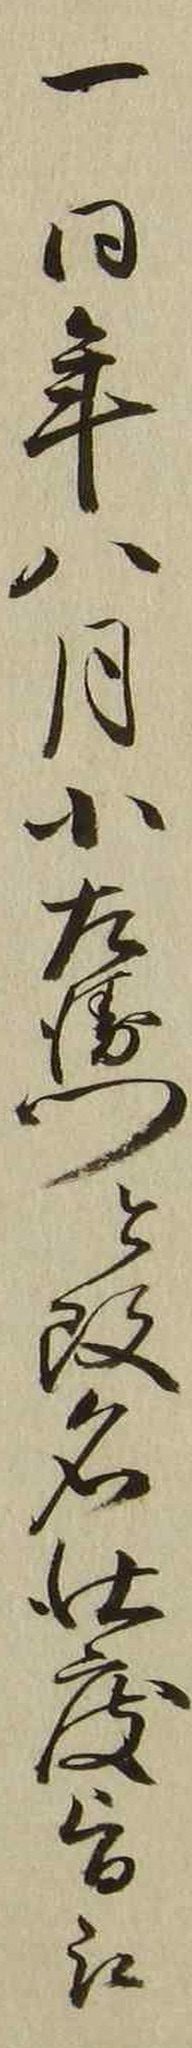一同年八月小左衛門と改名仕度旨被
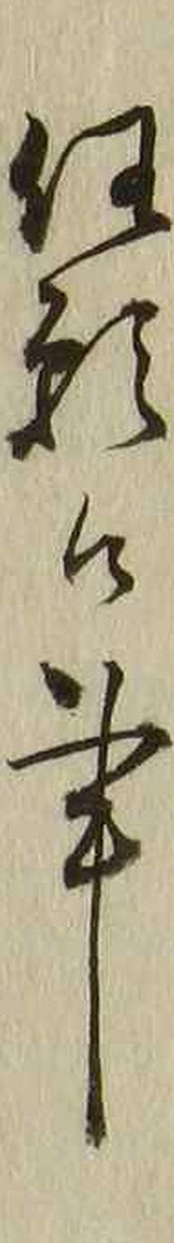任願候事
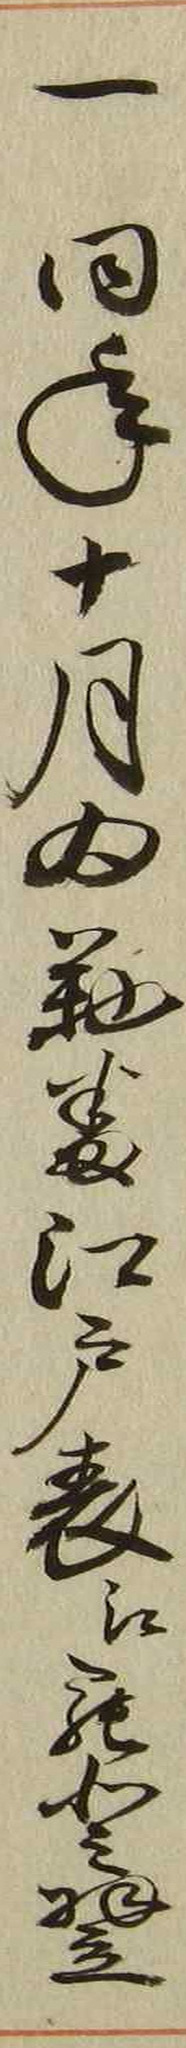一同年十月為勤番江戸表江罷登翌
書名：諸士系譜　巻之60　と之部3
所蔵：会津若松市立会津図書館
